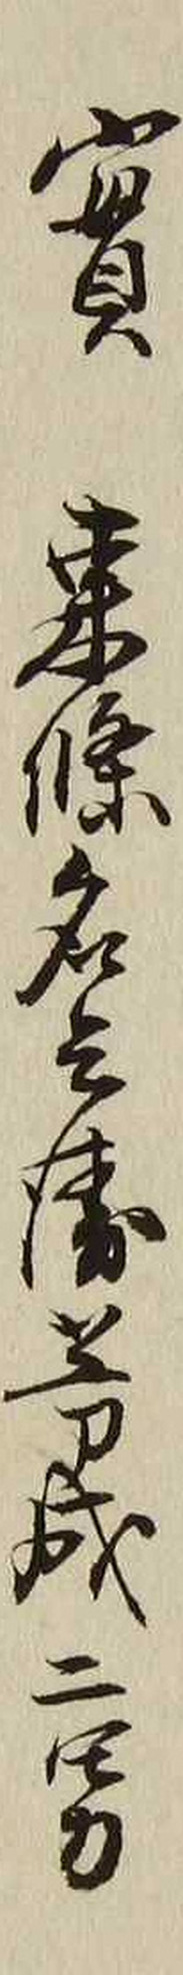実東条名兵衛芳成二男
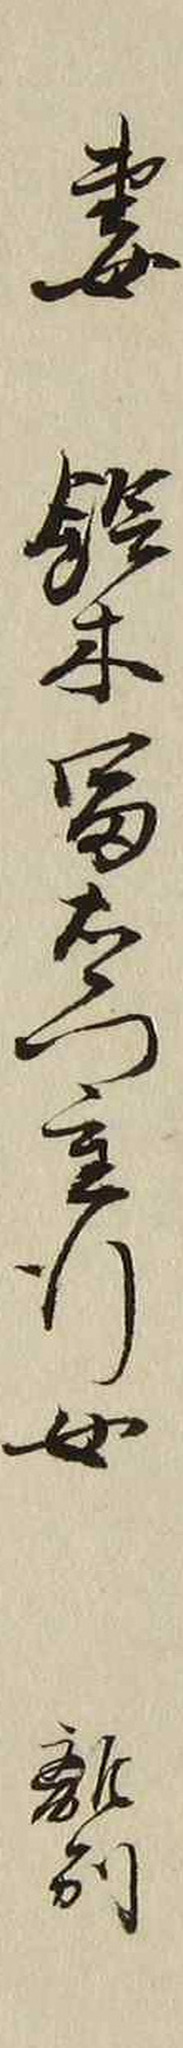妻鈴木富右衛門重行女離別
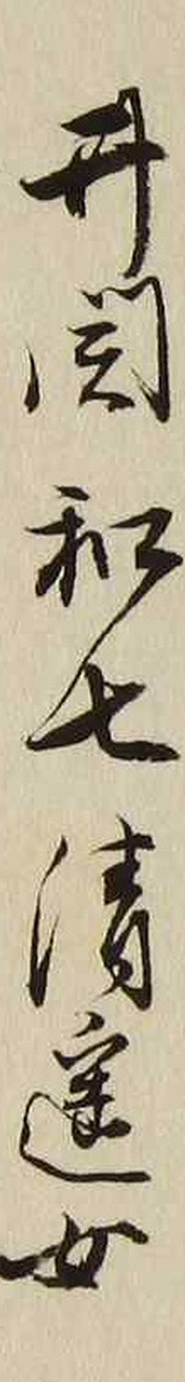井関和七清遥女
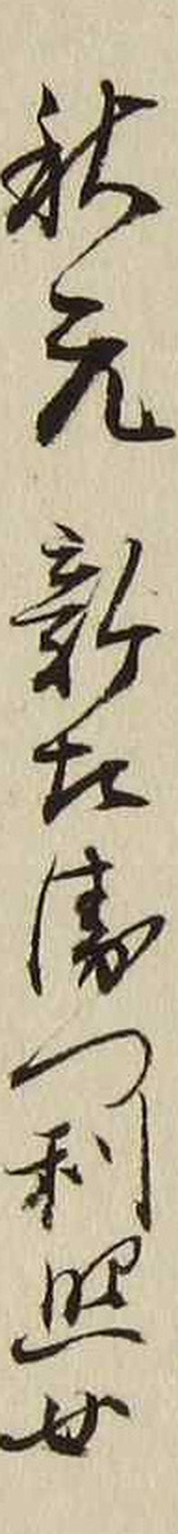秋元新左衛門利照女
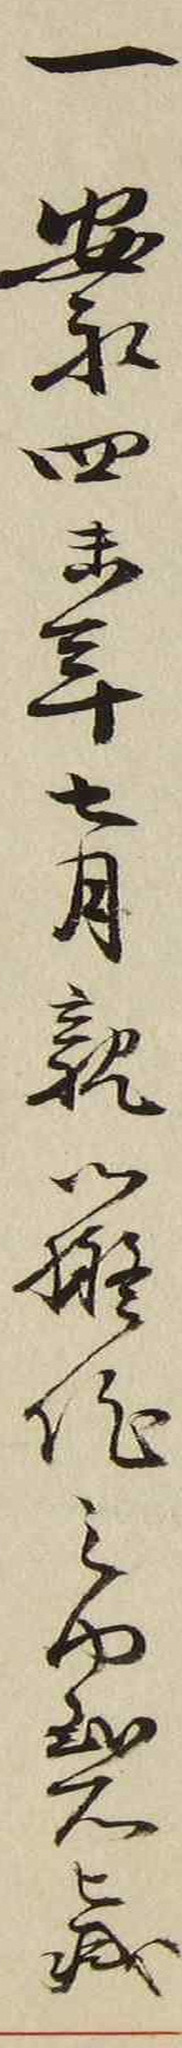一安永四未年七月親御擬作之内弐石被減
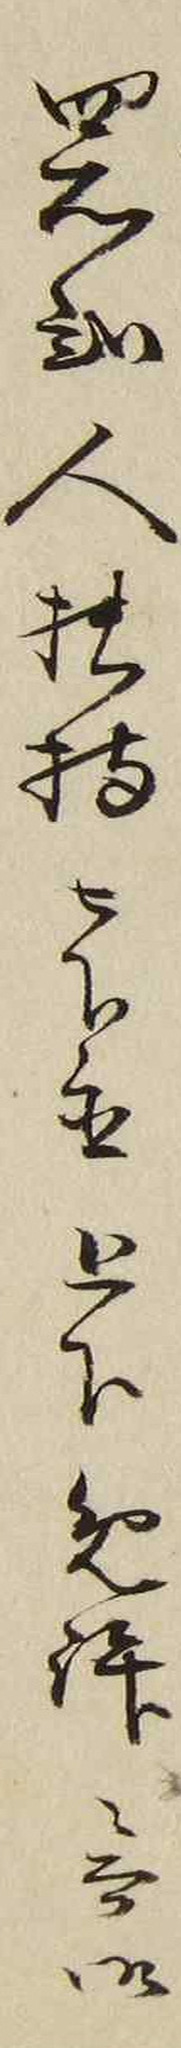四石弐人扶持被下置上下免許ニ而御

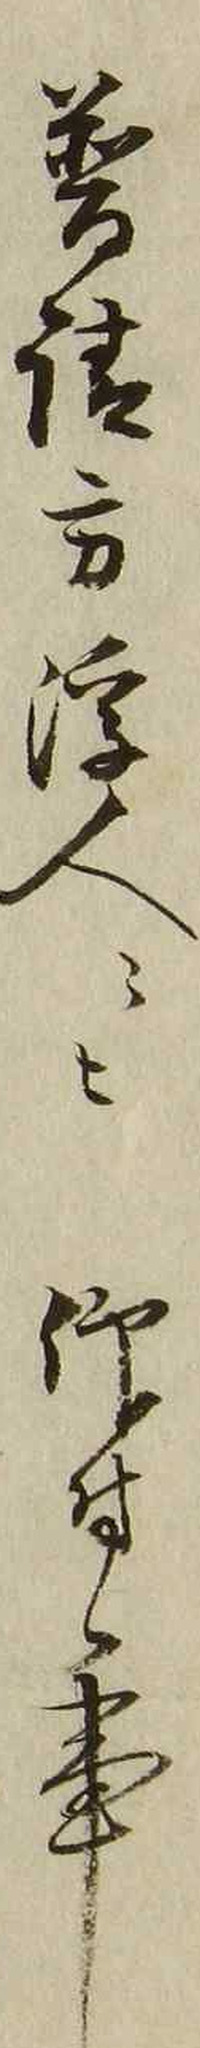普請方浮人ニ被仰付候事
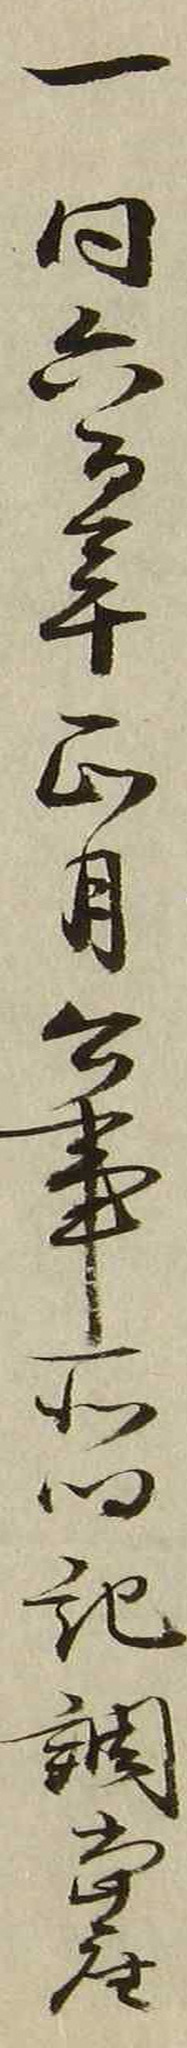一同六酉年正月公事所旧記調当座
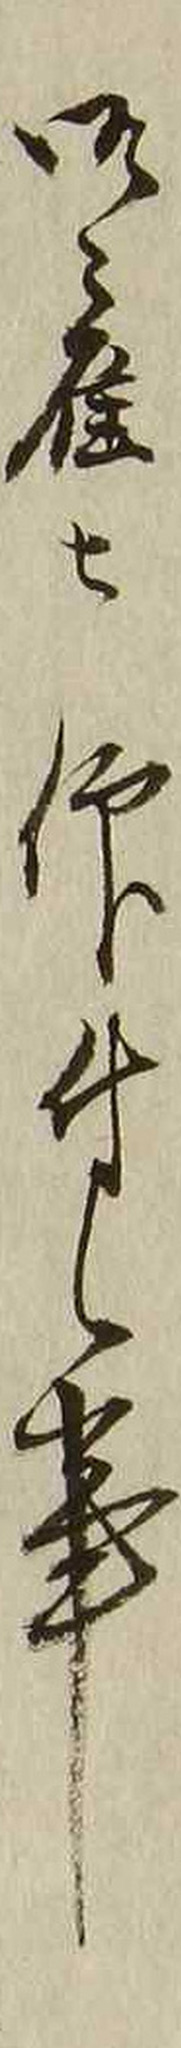御雇被仰付候事
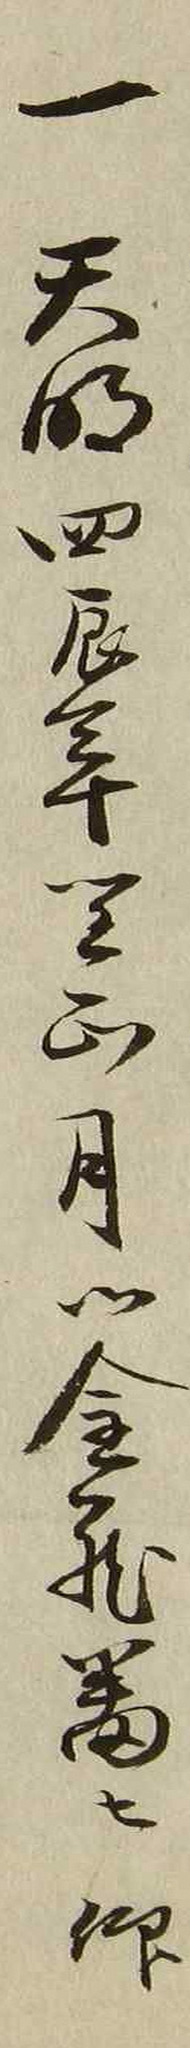一天明四辰年閏正月御金蔵番被仰
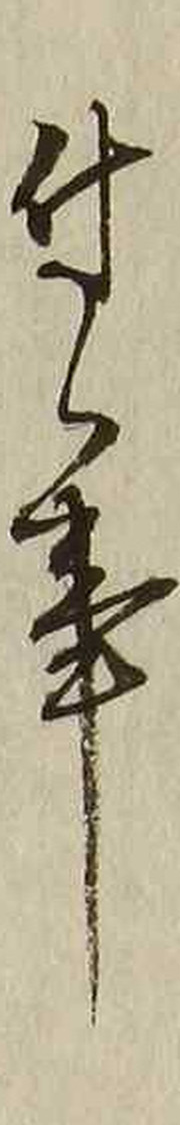付候事
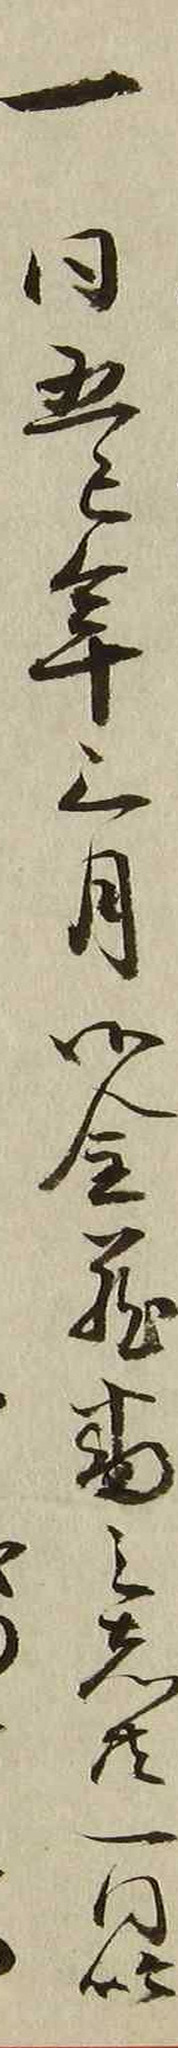一同五巳年三月御金蔵番之者共一同吟
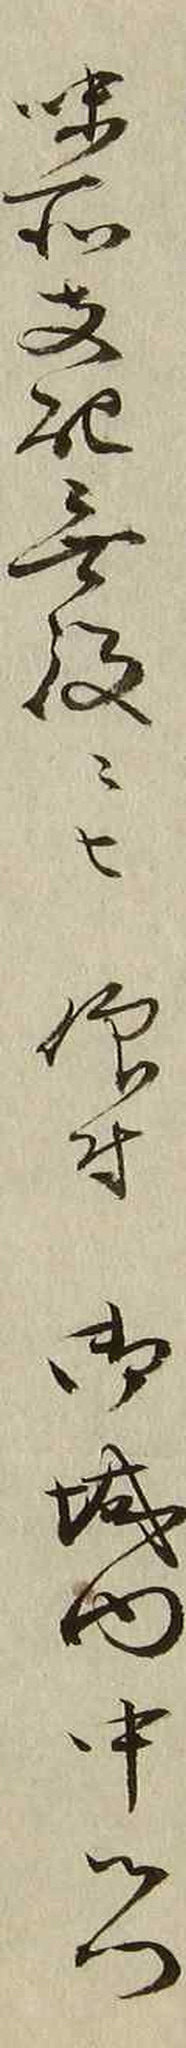味所支配無役ニ被仰付御城内中御門
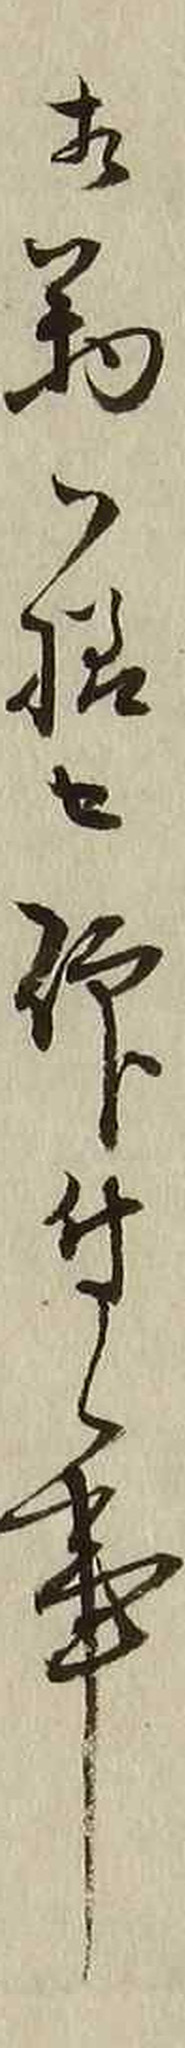相勤候様被仰付候事
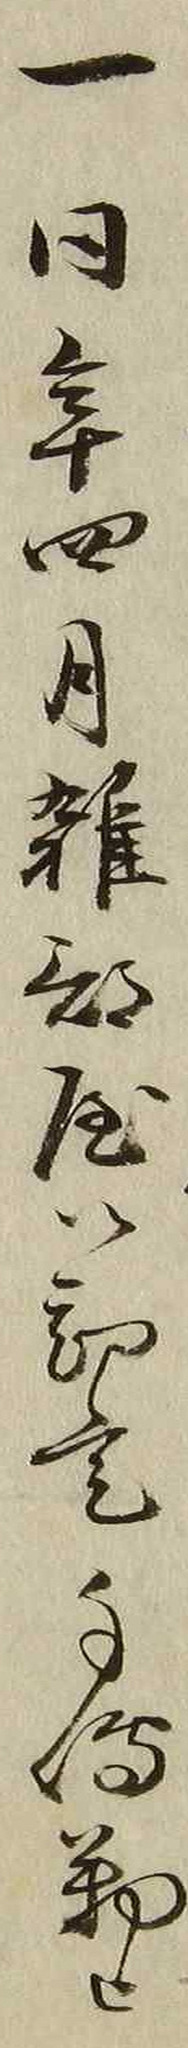一同年四月雑部屋御勘定手伝勤被
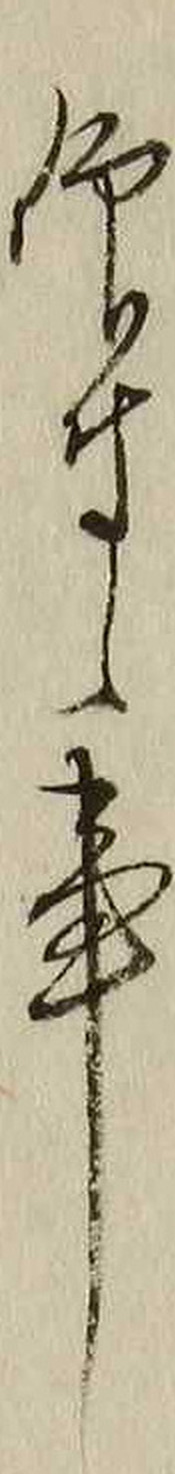仰付候事
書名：諸士系譜　巻之291　さ之部23
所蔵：会津若松市立会津図書館
